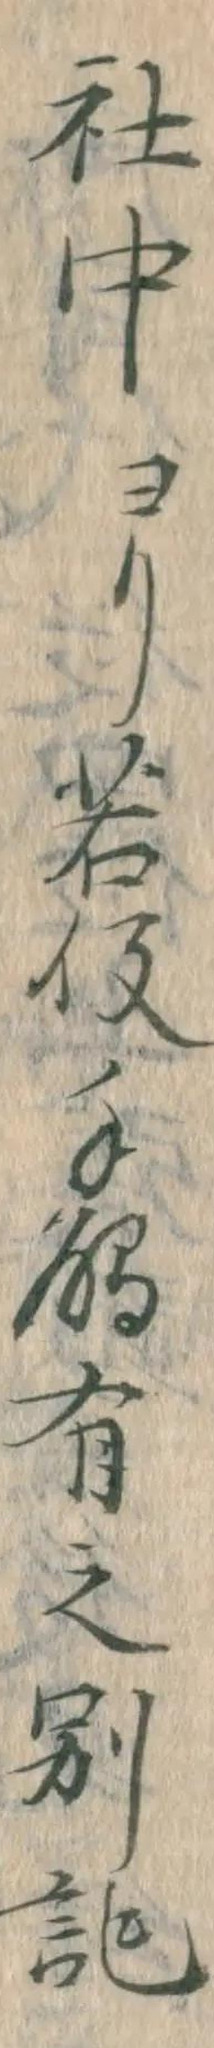社中ヨリ若役手触有之別記
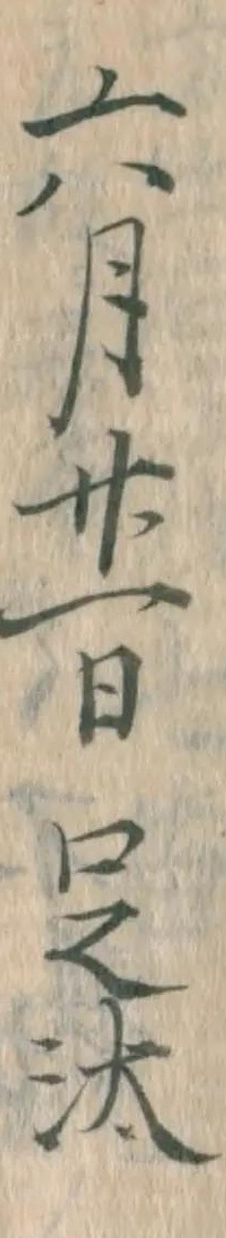六月廿一日足汰
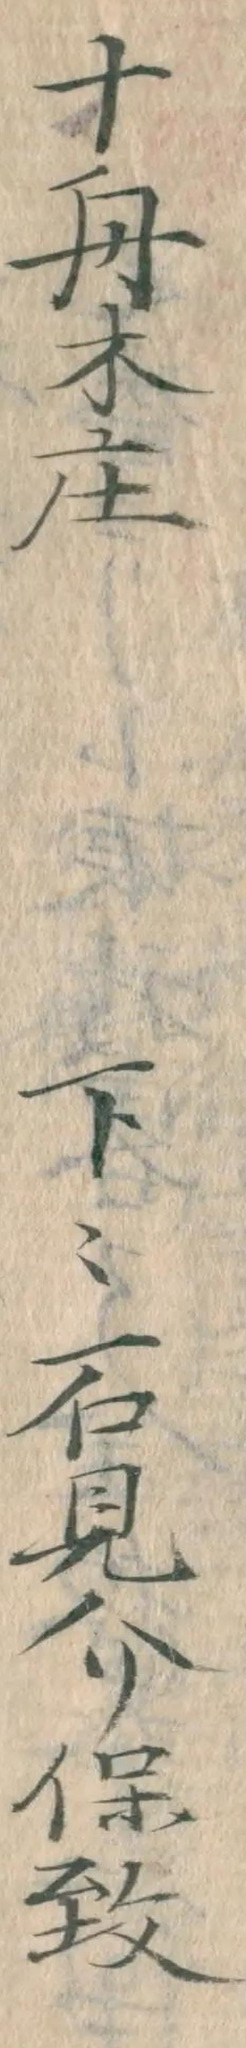十舟木庄下々石見介保致
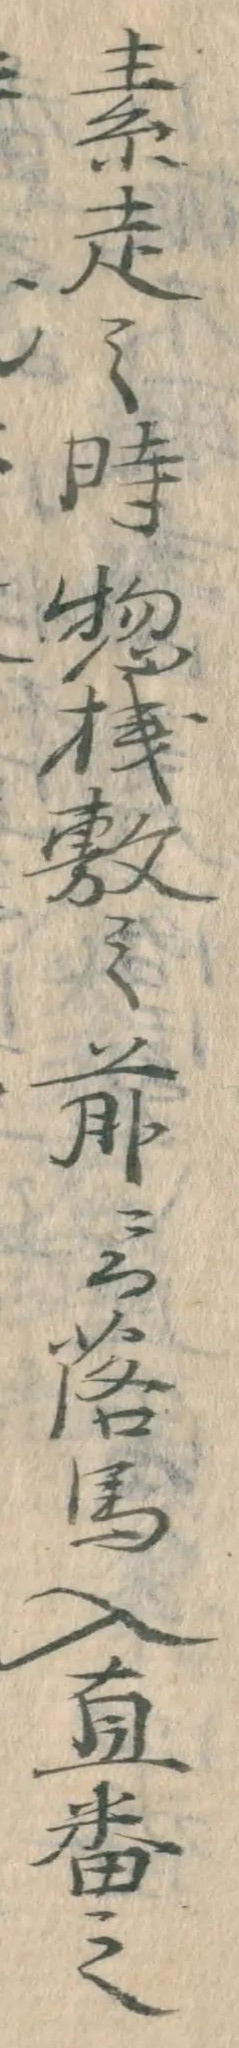素走之時惣桟敷之前ニ而落馬入直番之
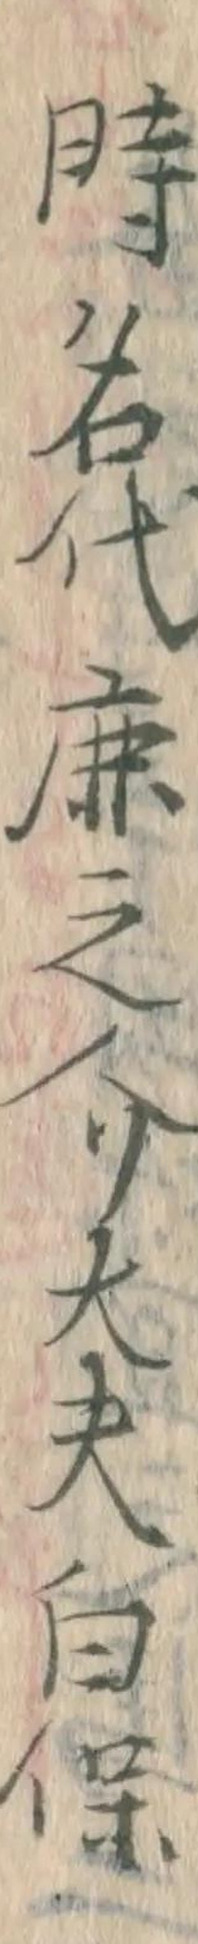時名代鹿之介大夫白保

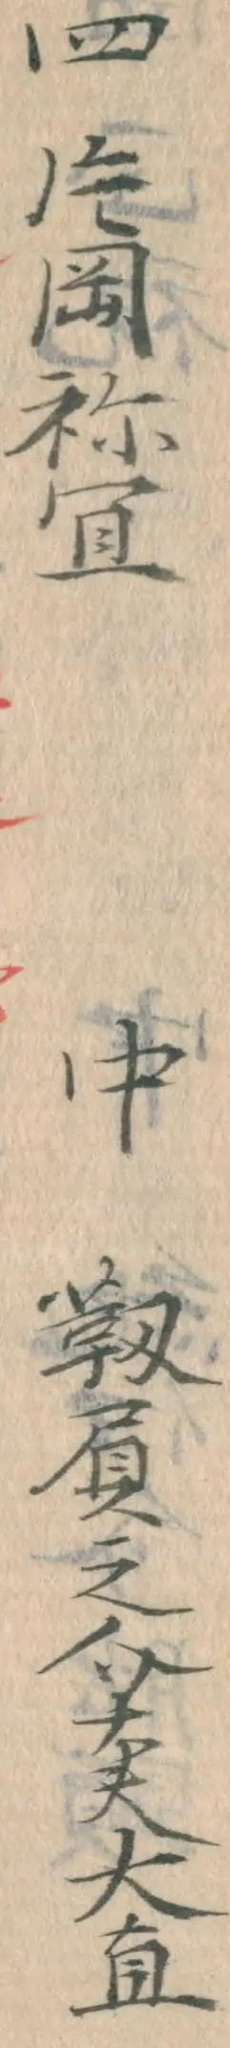四片岡祢宜中靭負之介大夫大直
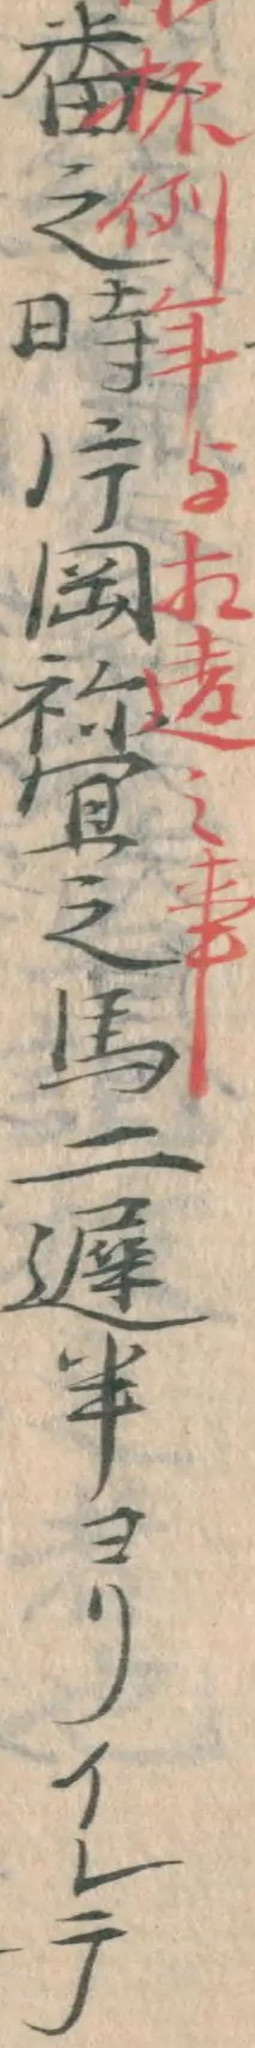番之時片岡祢宜之馬二遅半ヨリイレテ
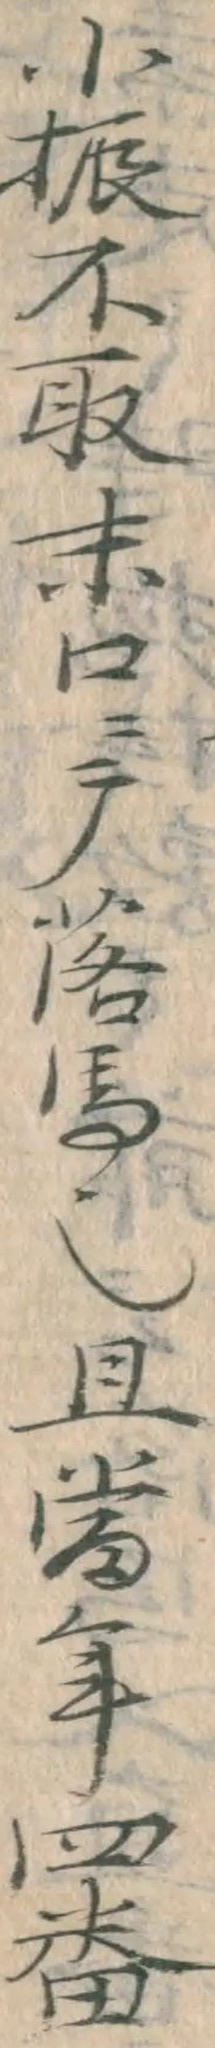小振不取末口ニテ落馬也且当年四番
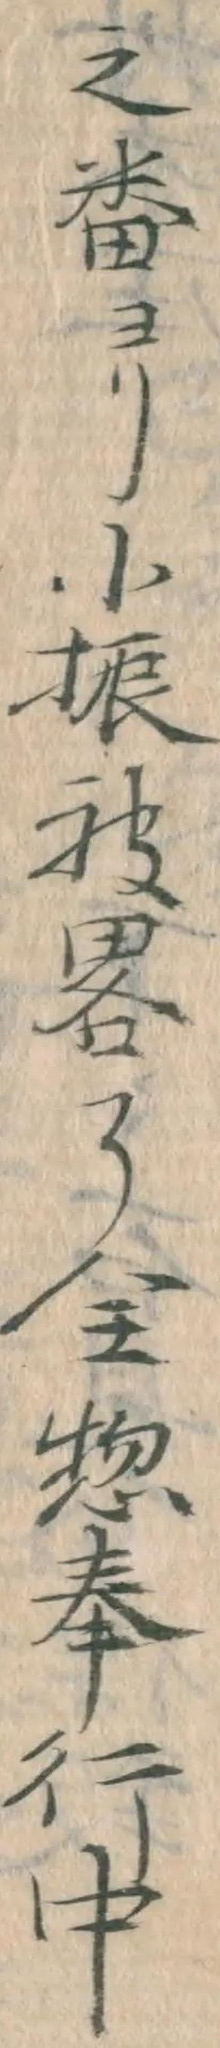之番ヨリ小振被略了全惣奉行中
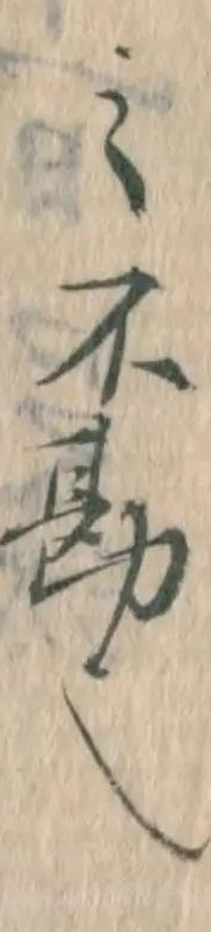之不勘也
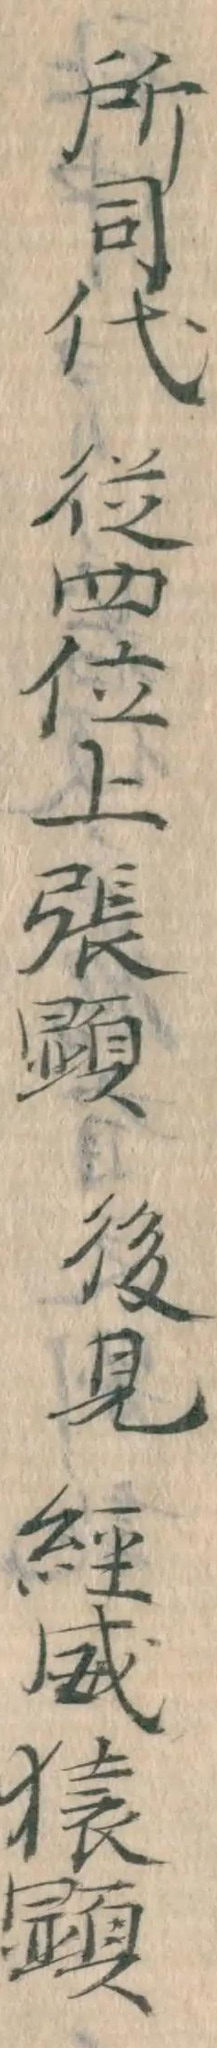所司代従四位上張顕後見経威猿顕
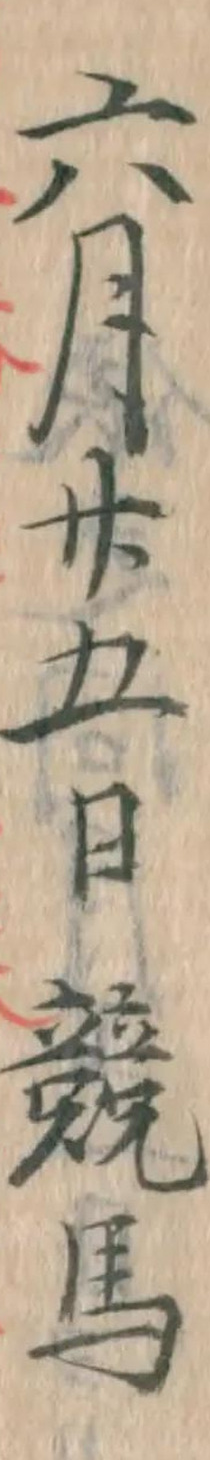六月廿五日競馬
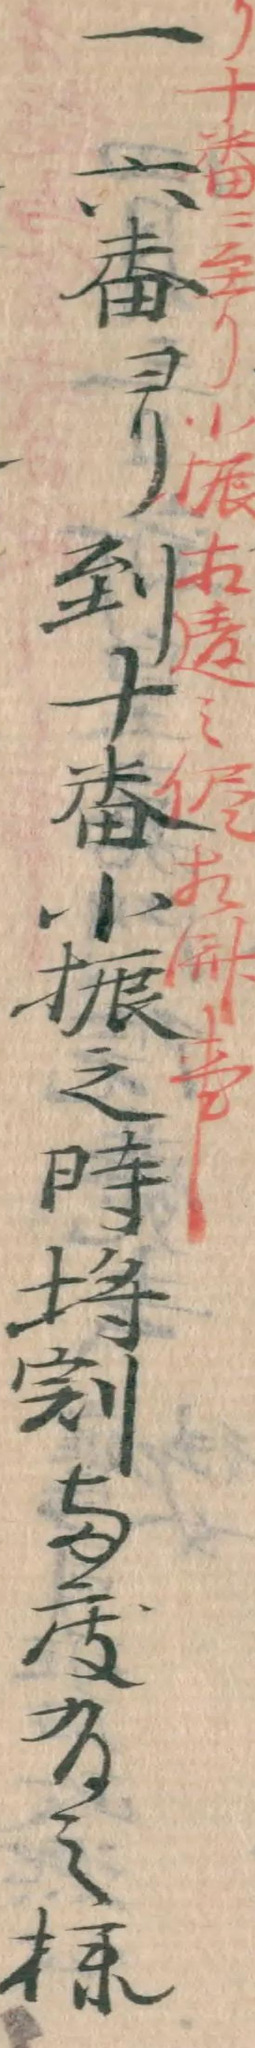一六番ヨリ到十番小振之時埒割両度有之様
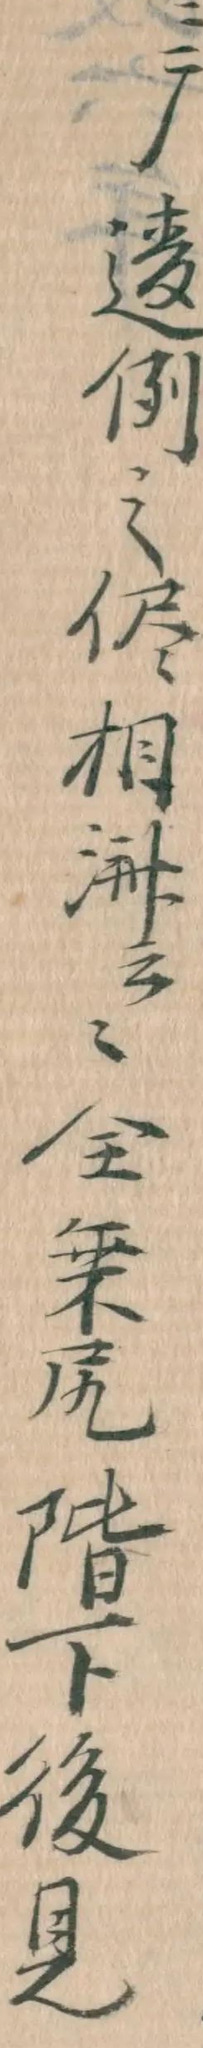ニテ違例之侭相済云々全乗尻階下後見
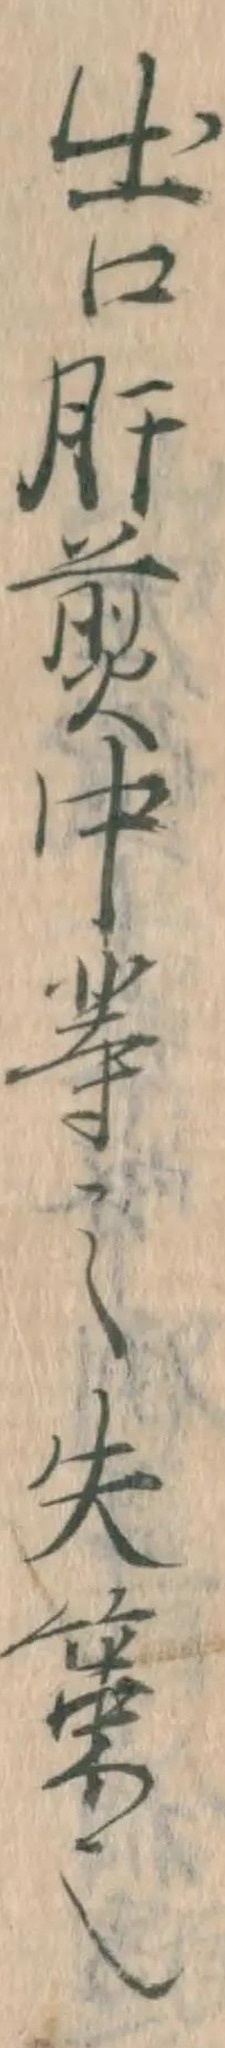出口肝煎中等之失策也

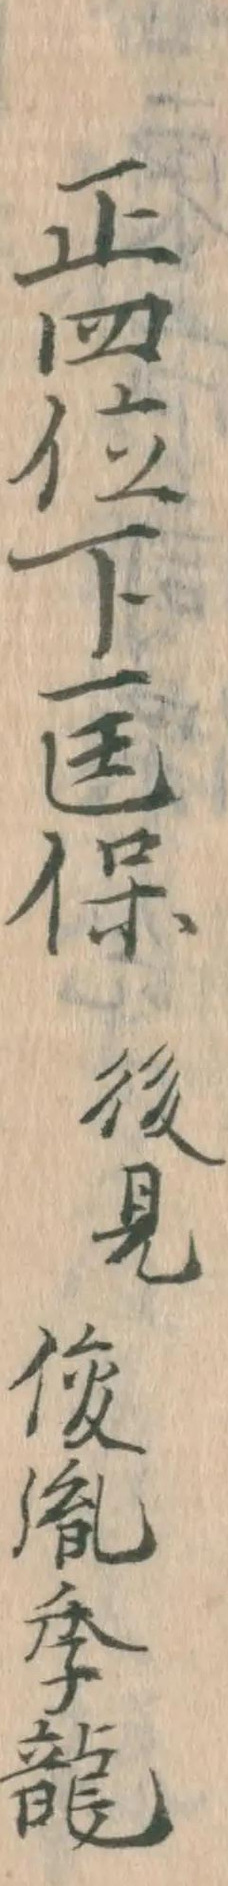右正四位下匡保後見俊胤季龍
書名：賀茂社記録. 第10冊
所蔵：国立国会図書館 National Diet Library, JAPAN
